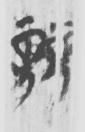辡
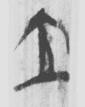立
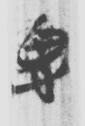思
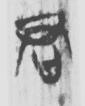君
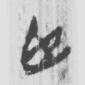臣
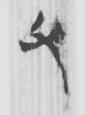父
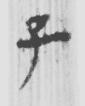子
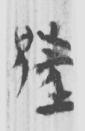{兄㞷}
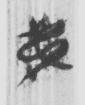弟
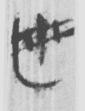母
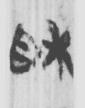相
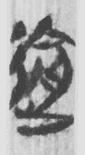逾
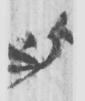此
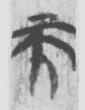天
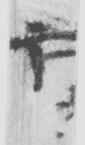下
